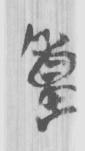重
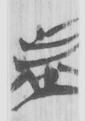者
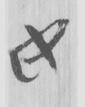女
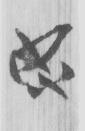奴
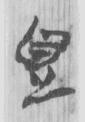見
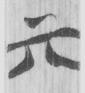亓
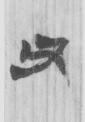父
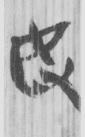奴
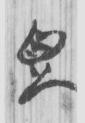見
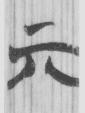亓
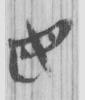母
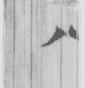八
